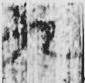九
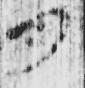月
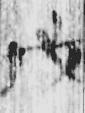戊
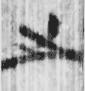之
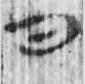日
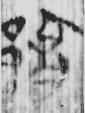○（宛）
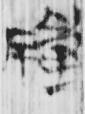○（陳）
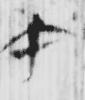午
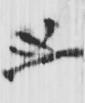之
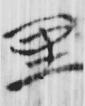里
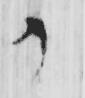人
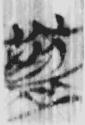藍
